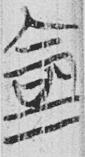命
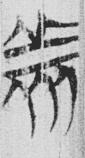羕（永）
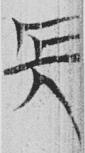長
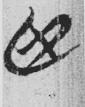臣
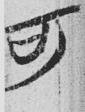可（何）
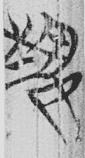○（藝）
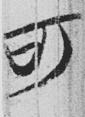可（何）
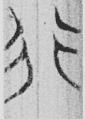行
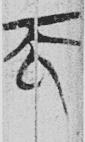而
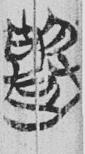○（舉）
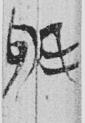於
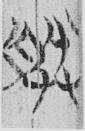朕
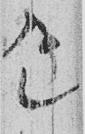身
